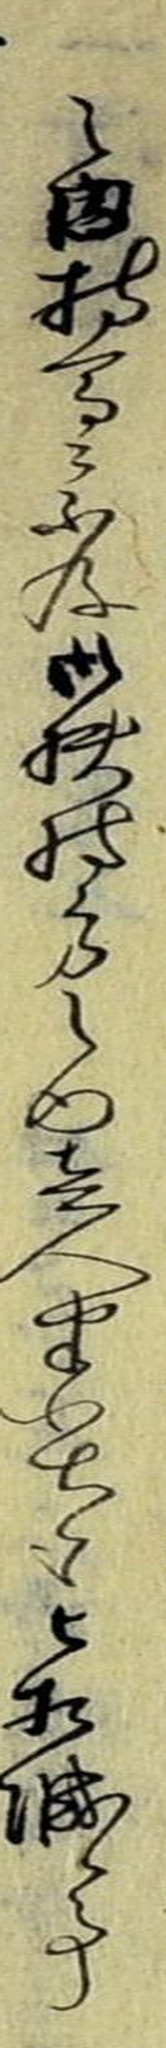之間持高に不及御扶持方之内壱人半ふちつヽ被相減候事
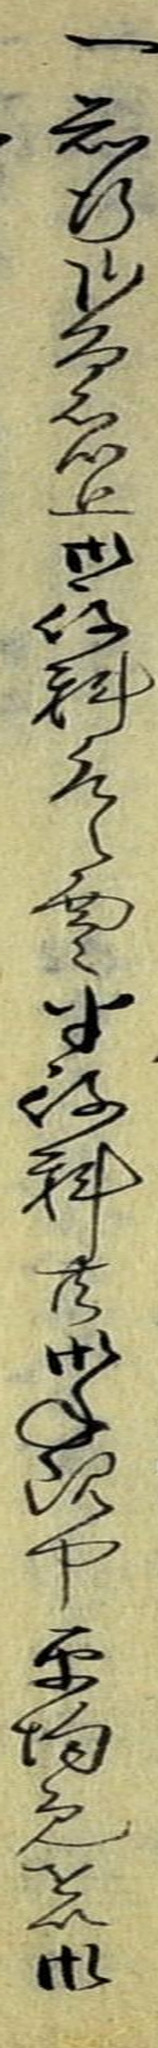一知行弐百石以上御役料取之面々半役料共御年限中平均免を以御
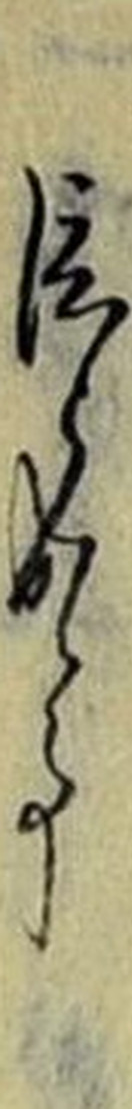渡被成候事
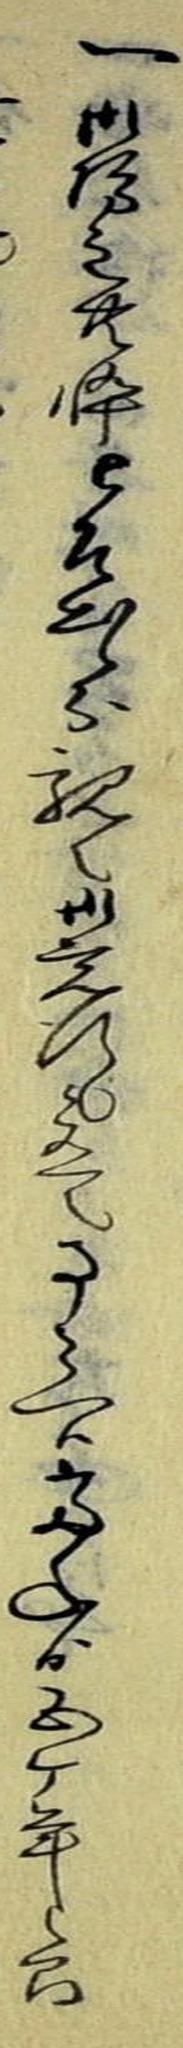一御坊主共伜被召出候分親之御充行も有之事に候へは当年ゟ五ヶ年之間
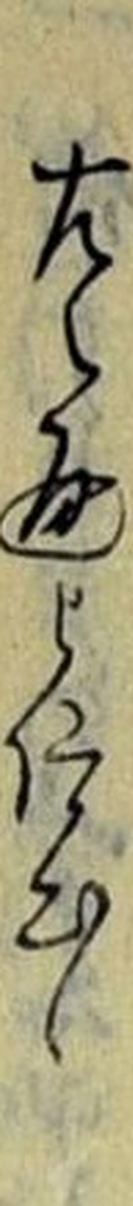左之通被仰出候
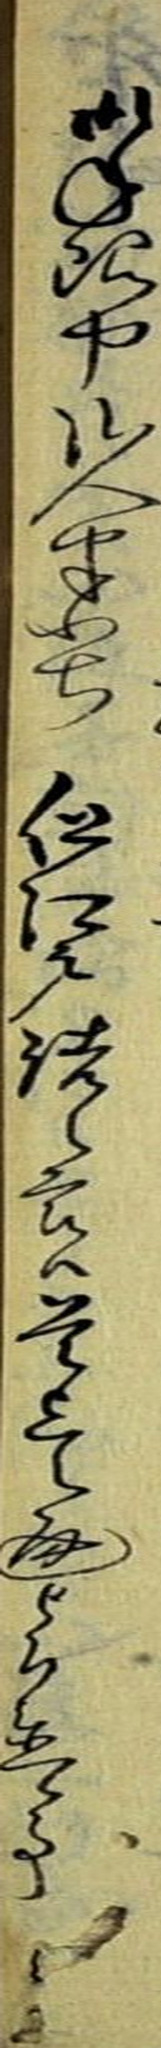御年限中弐人半ふち但江戸詰之節は是迄之通被下置候事
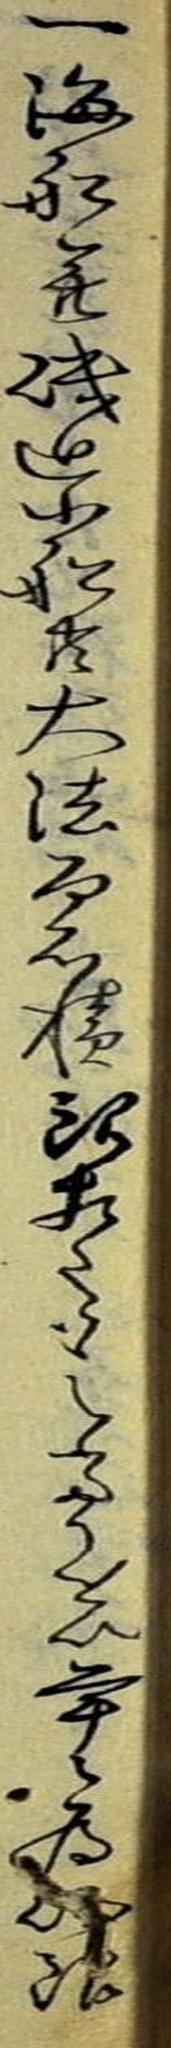一海船并磯廻り小船共大法百石積銀拾匁つヽ之当りを以年々為役銀
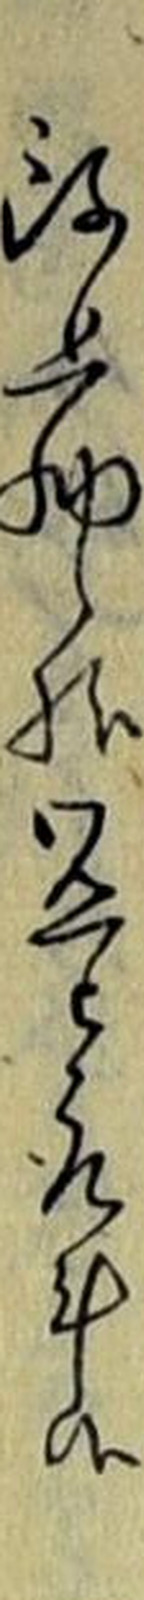致上納候様宜被取斗候
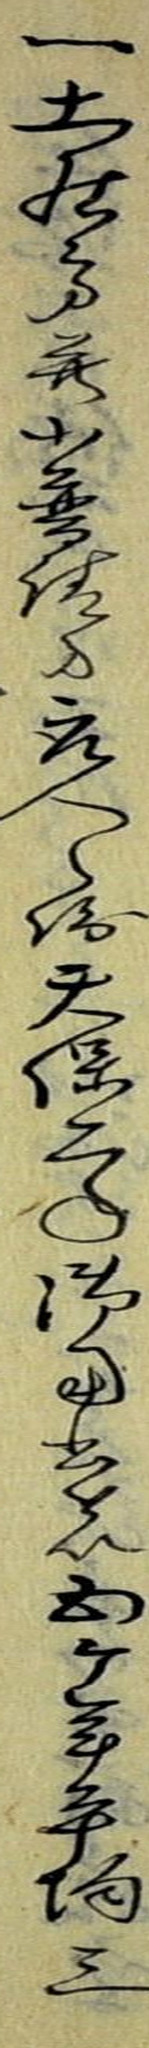一土居方并小普請方取人之儀天保二年御用書を以五ヶ年平金三
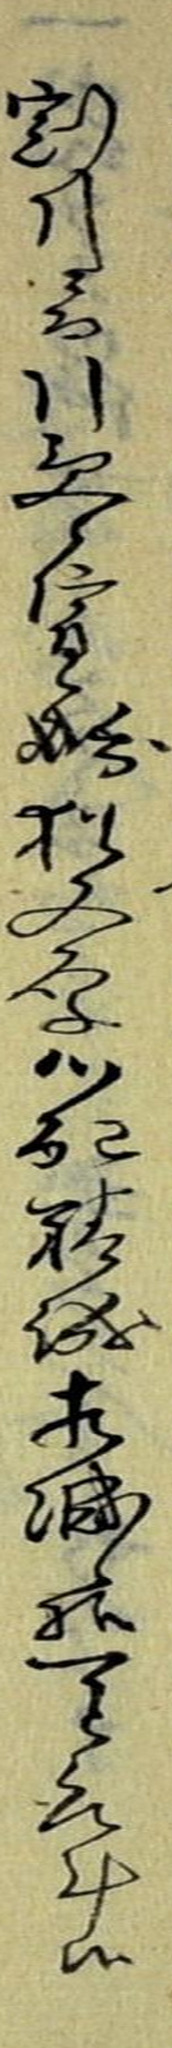割引に而引受被仰付候分猶又厚心配精誠相減候様可被取斗候
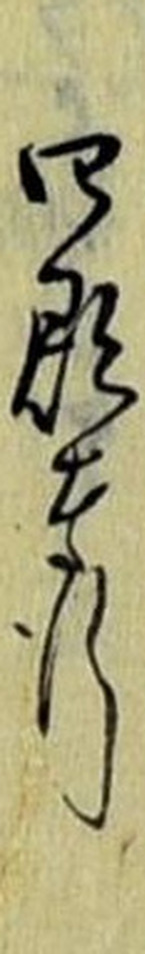四郡奉行
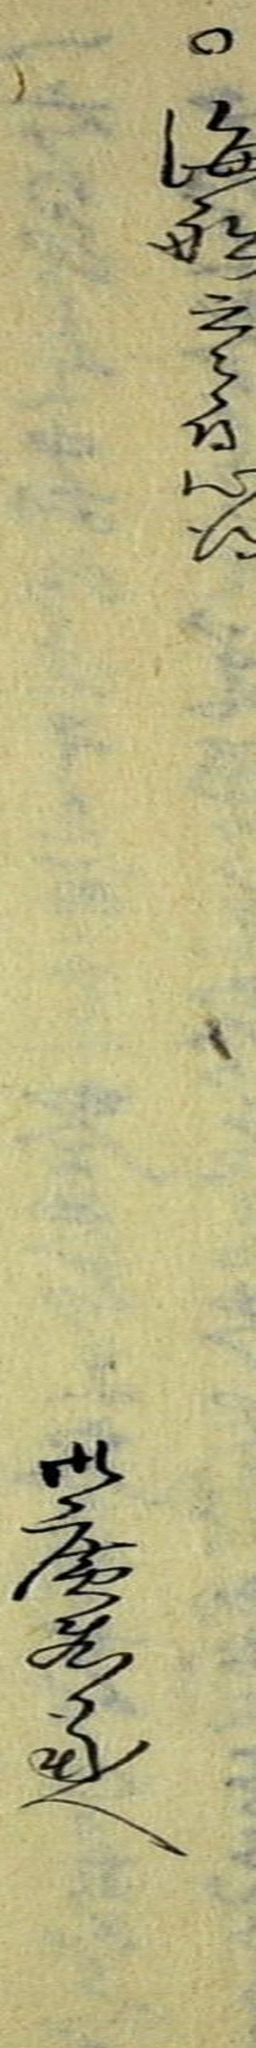御広敷御用人
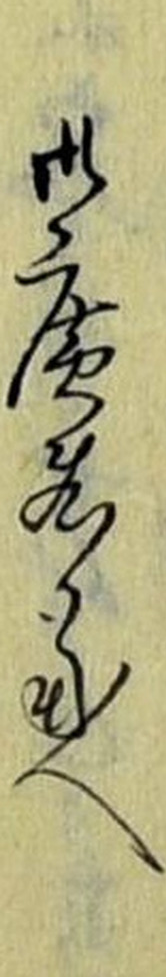御広敷御用人
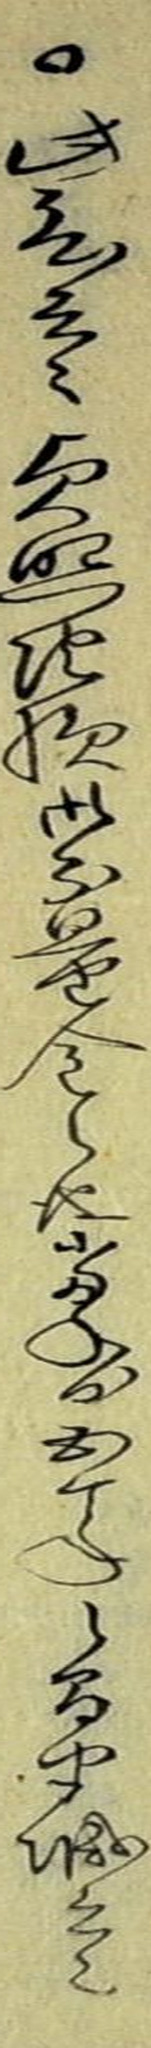○此度云々貞照院様御分量金之儀当年ゟ五ヶ年之間半減云々
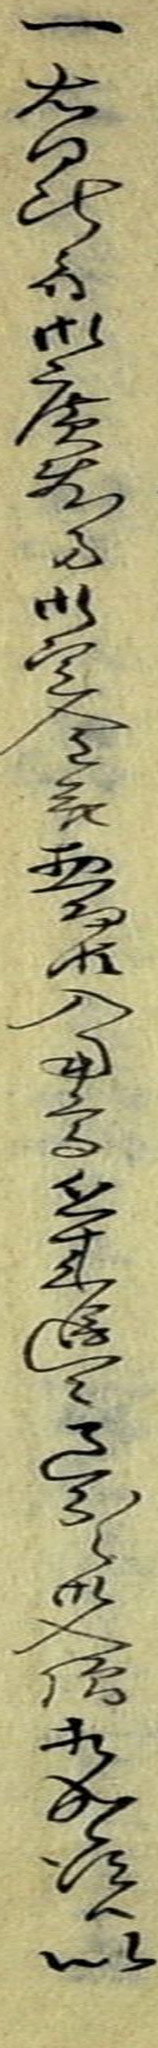一右同断に付御広敷方御定金并惣而御入用高近年追々過分之御入増相成候得は以
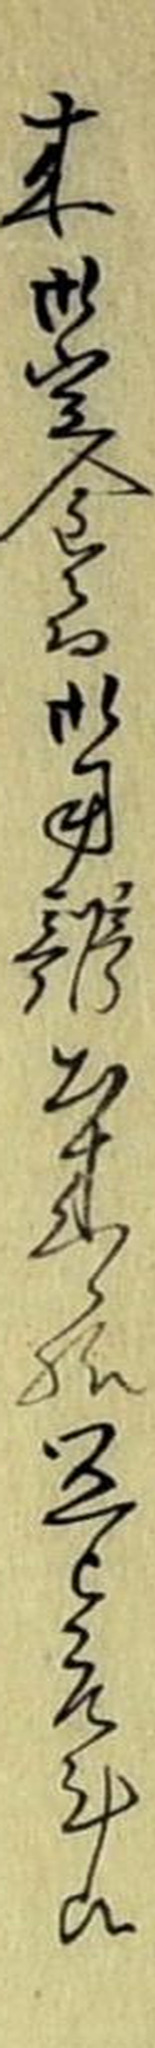來御定金に而御用弁出来候様宜被取斗候
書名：命令之部 六
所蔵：福井県文書館 Fukui Prefectural Archives
